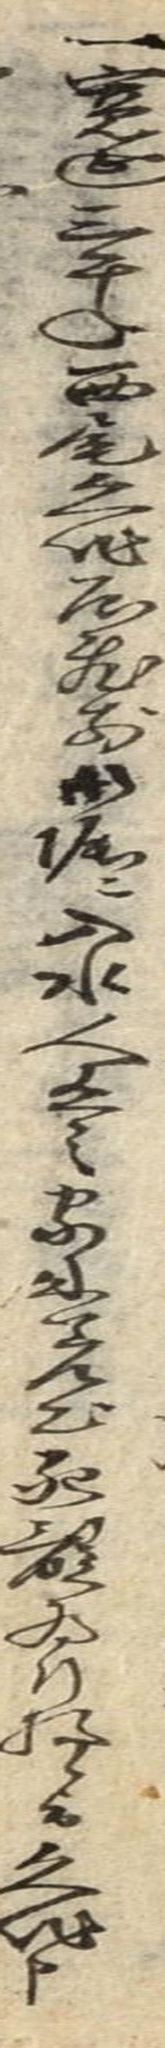一寛延三午年西尾久作屋敷前御堀に入水人有之家来差出死骸為引揚候旨久作申
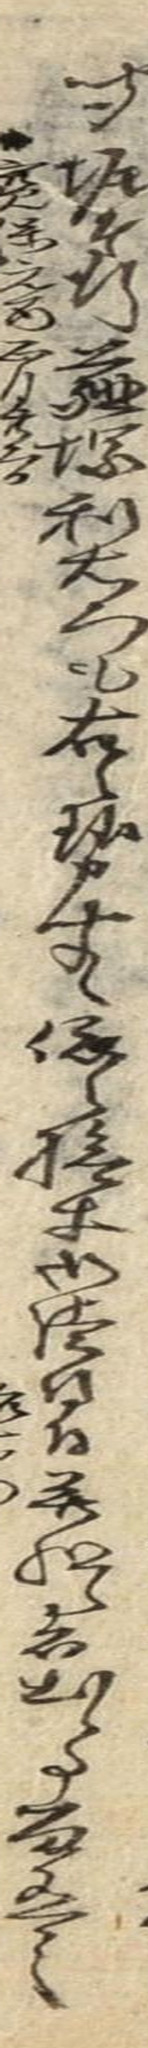聞堀奉行薤塚利右衛門も右之趣申聞候依之検使御徒目付并組之者出候事留有之
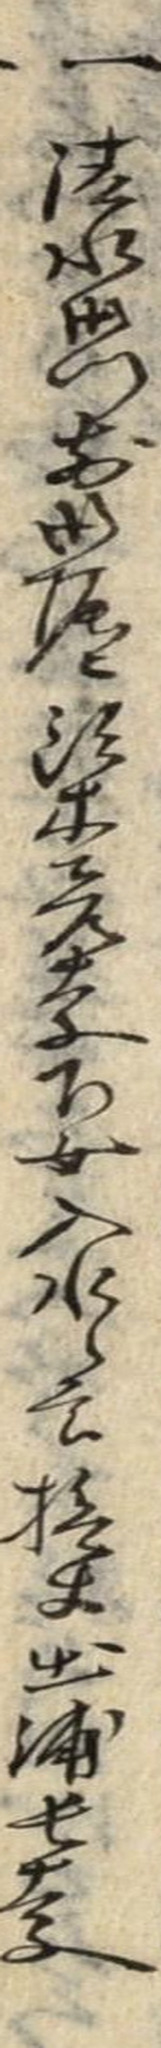一清水御門前御堀に鈴木彦大夫下女入水之節検使出浦長大夫
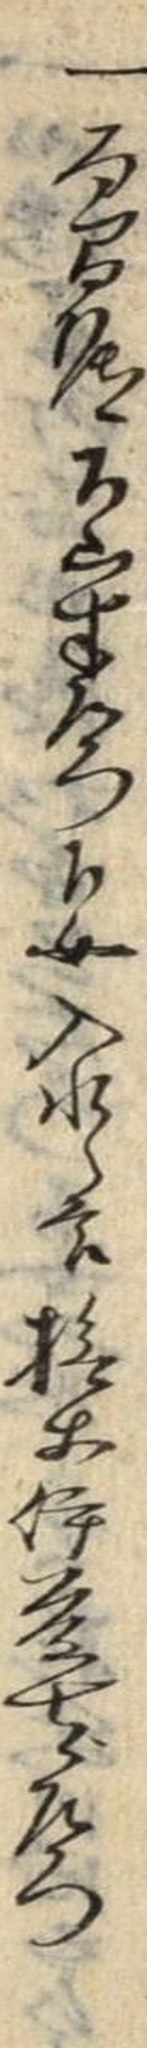一百間堀へ下山半左衛門下女入水之節検使伊藤七郎左衛門

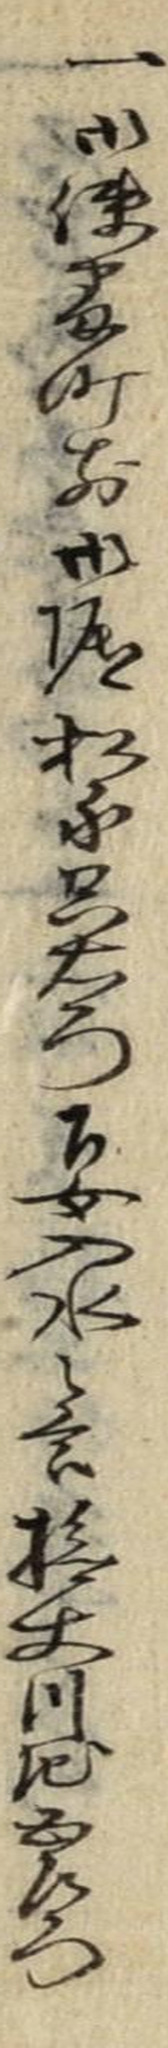一御使番町前御堀へ松永只右衛門下女入水之節検使川地五左衛門
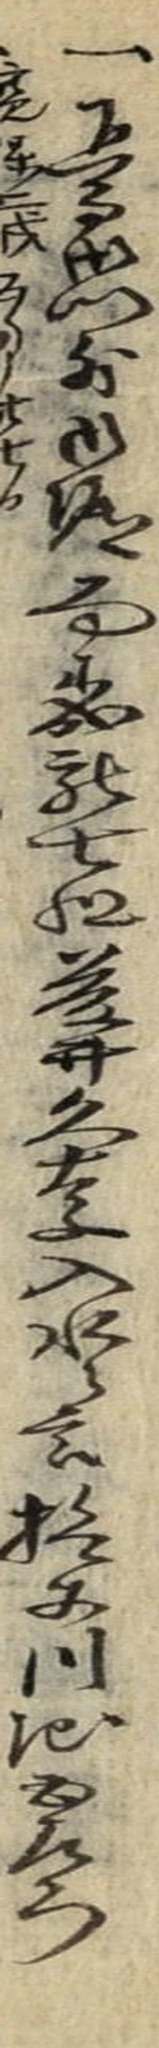一下馬御門前御堀へ雨森新七組藤井久大夫入水之節検使川地五左衛門
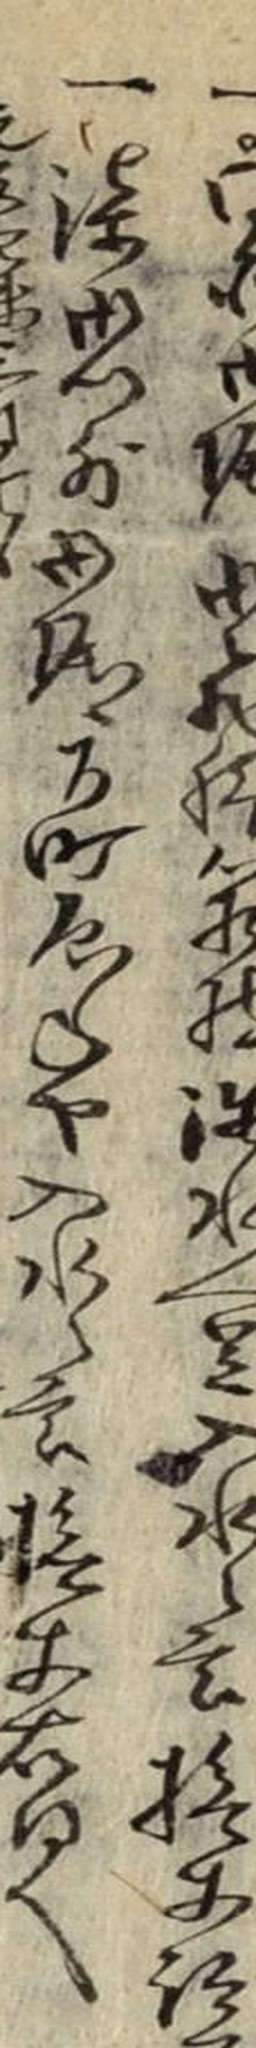一漆御門前御堀へ下町屋ねや入水之節検使右同人
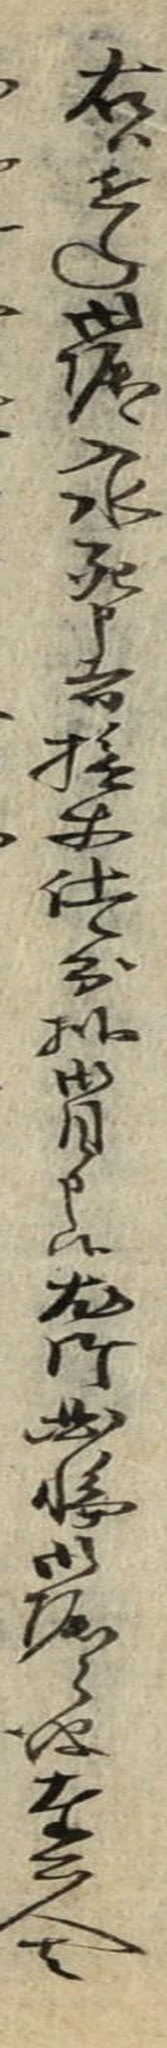右は近年御堀へ入水死申者検使仕候分掛御目申候尤御曲輪御堀之儀奉公人は
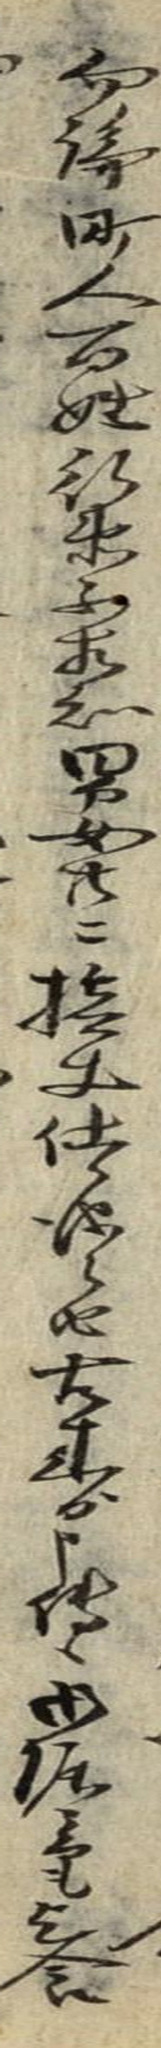勿論町人百姓行衛不相知男女共に検使仕候儀之由古来ゟ申伝候御堀に而も乞食
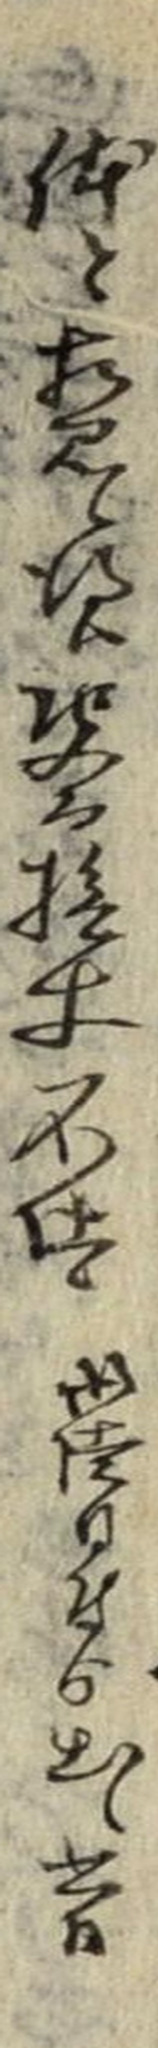体と相見候得は決而検使不仕候御徒目付ゟ出候書付
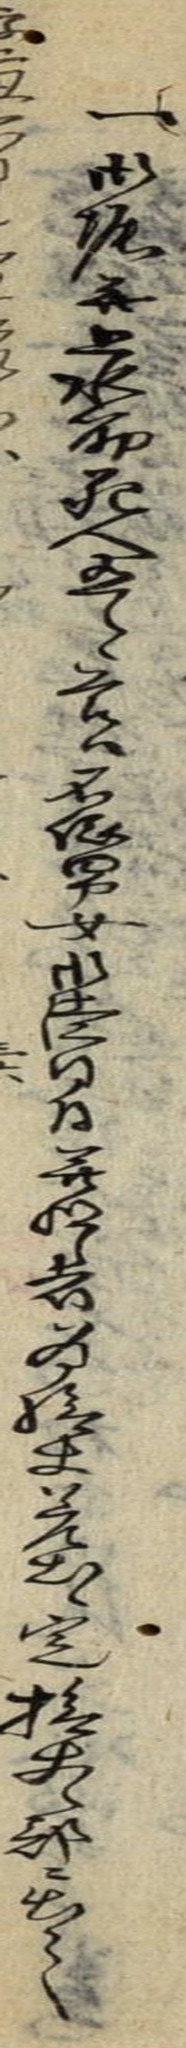一御堀并上水筋死人有之候節は不依男女御徒目付并組之者為検使差出候定検使之部に出之
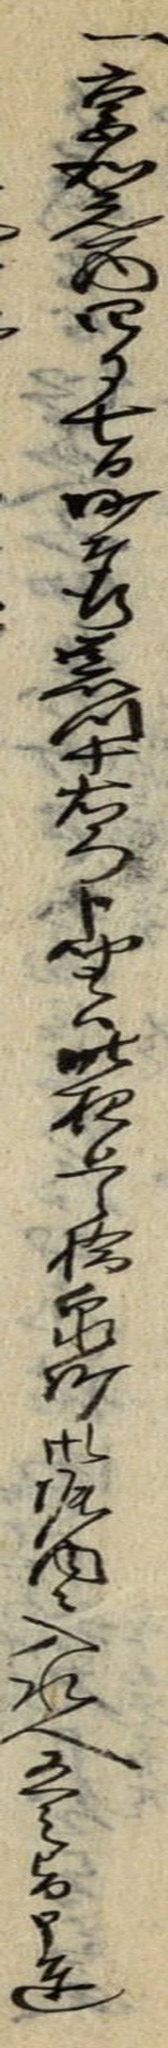一享和元酉四月七日町奉行荒川十右衛門申聞候は昨夜上之橋泉町御堀内に入水人有之旨申達
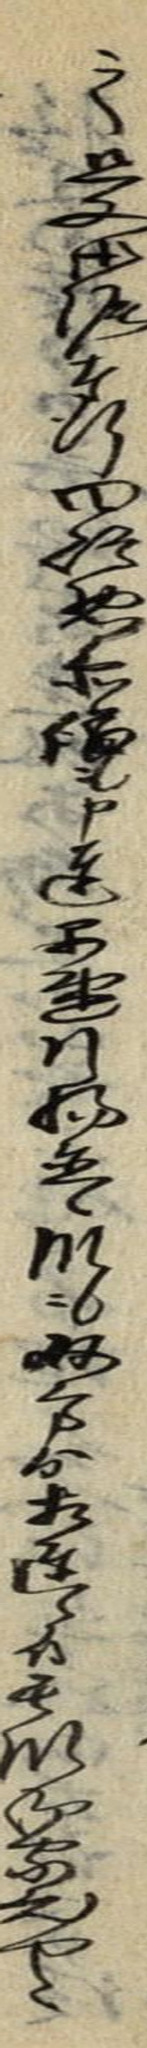之且又御堀奉行田嶋惣兵衛儀も申達早速引揚置候段も双方ゟ相達候に付其段御家老中へ
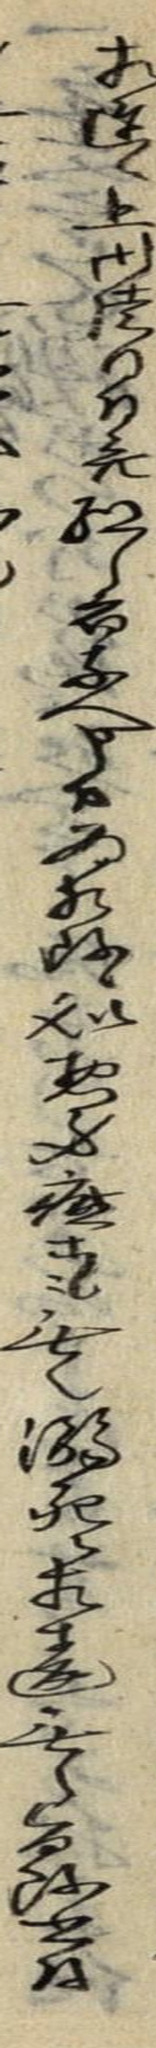相達候上御徒目付并組之者両人申付為相改候処惣身疵等も無之溺死に相違無之旨改書付
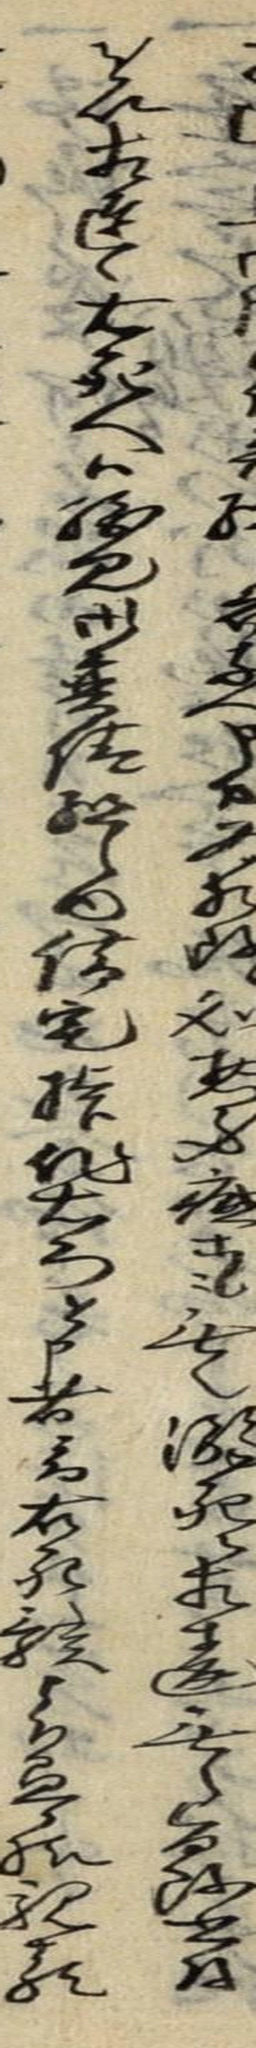を以相達候右死人は勝見御普請組之内借宅挊作右衛門と申者に而右死骸被下置候様親類
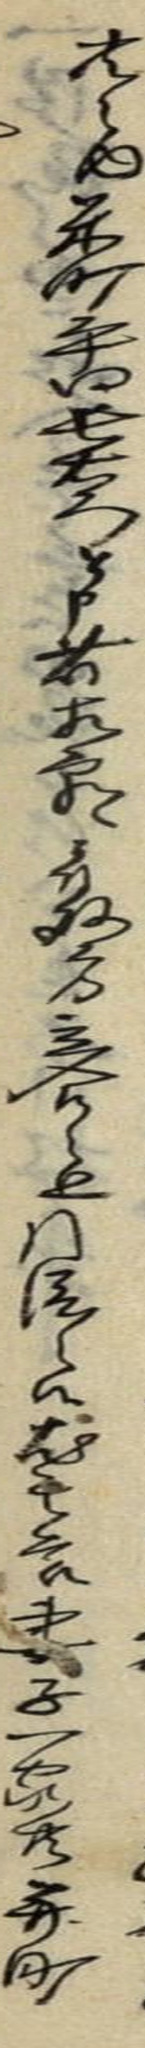共之内米町平田長右衛門と申者相願候に付双方立合之上引渡之候尤其節妻子一家共并町
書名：御停止異変死失
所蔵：福井県文書館 Fukui Prefectural Archives
